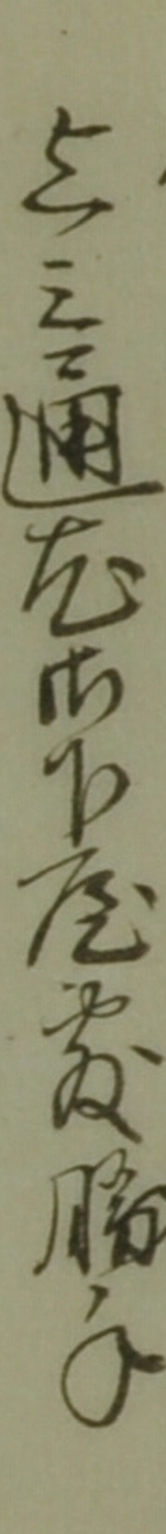迄之通尤御下屋敷勝手
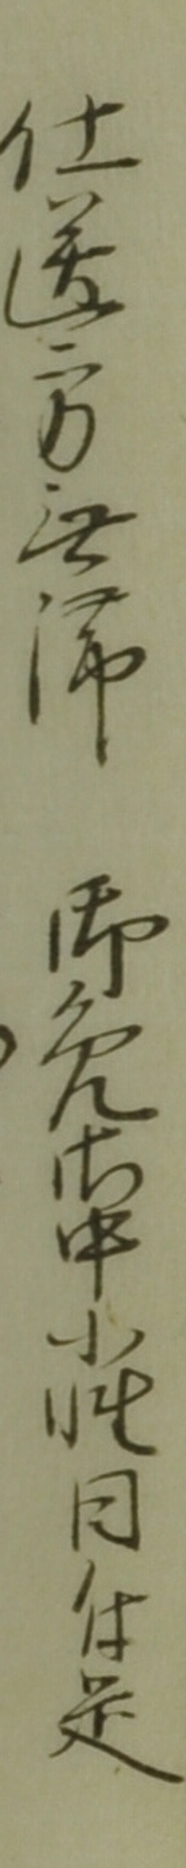仕送方無滞御免御中小性目付是
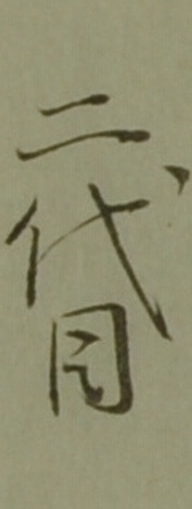二代目
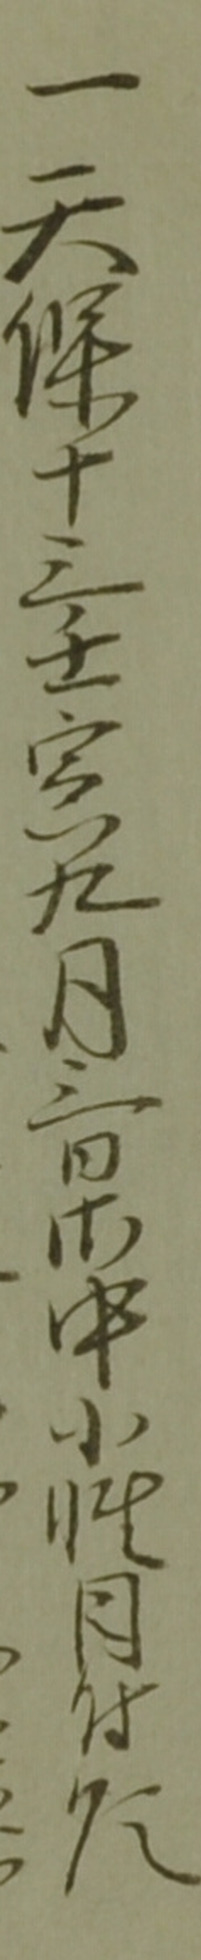一天保十三壬寅九月三日御中小性目付次
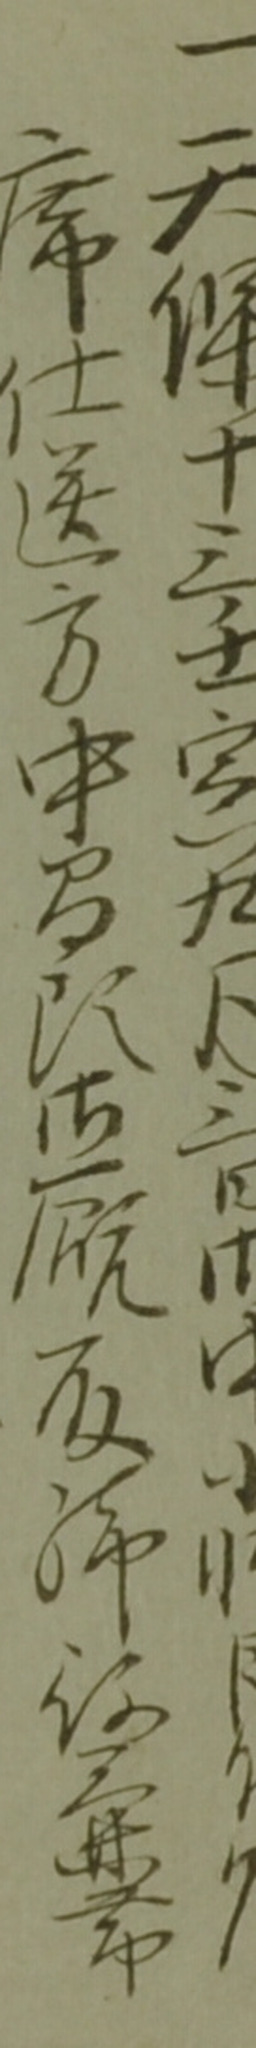席仕送方中間頭御厩取締役兼帯
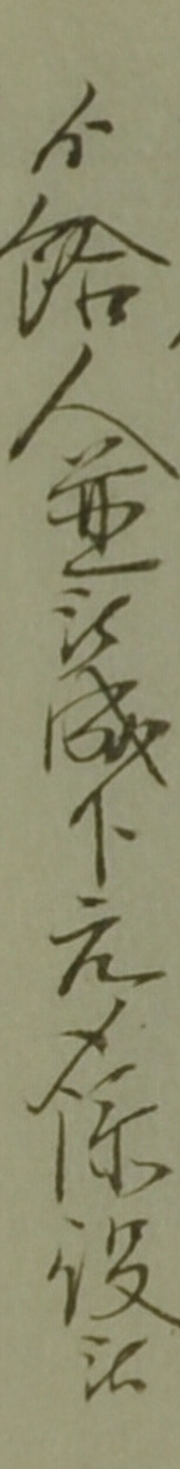ゟ給人並被成下元〆添役被
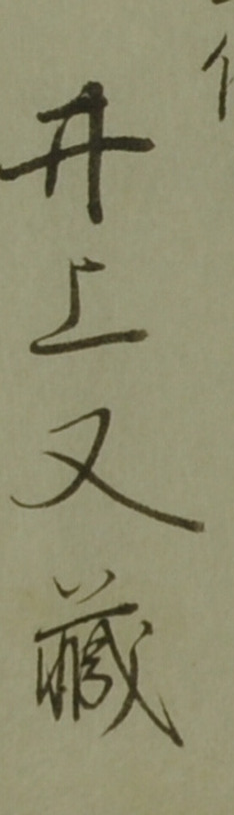井上又蔵
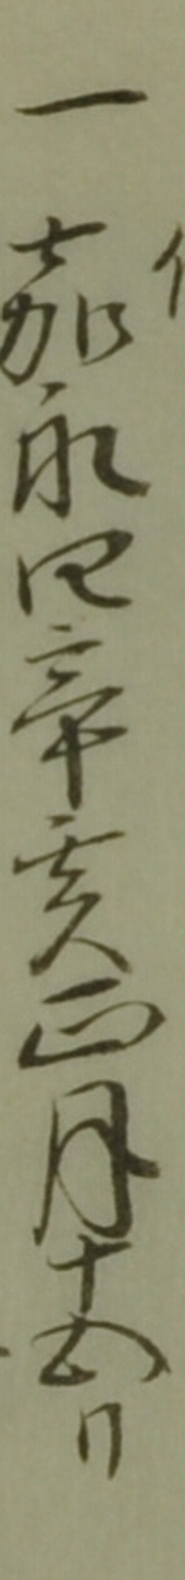一嘉永四辛亥正月十五日
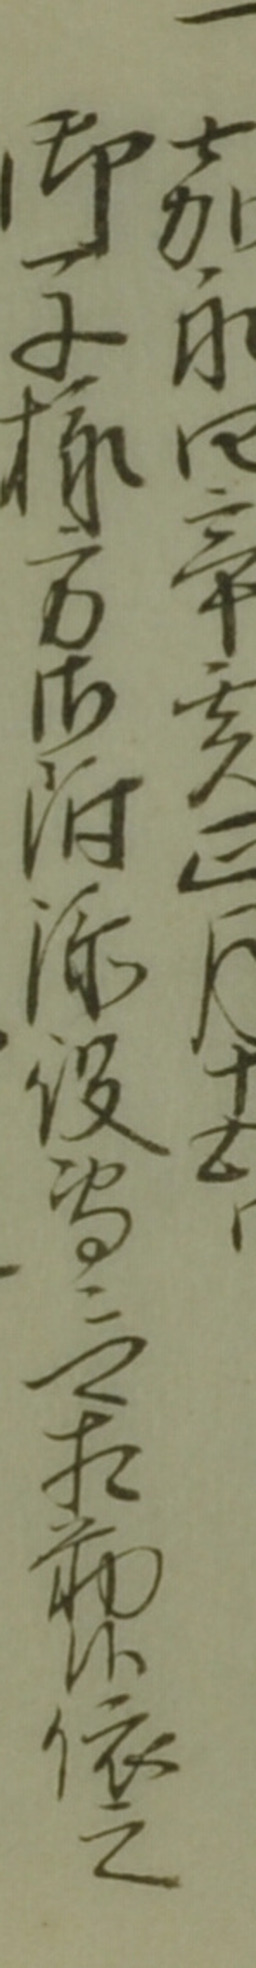御子様方御附添役専ニ可相勤候依之
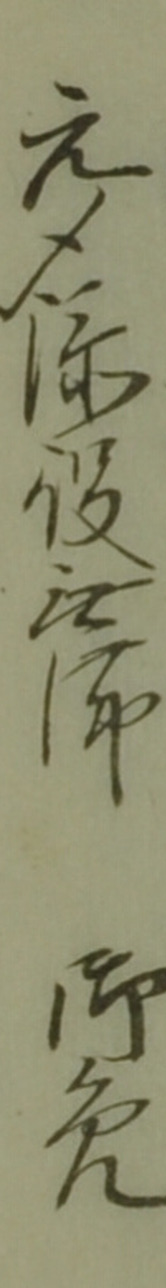元〆添役無滞御免
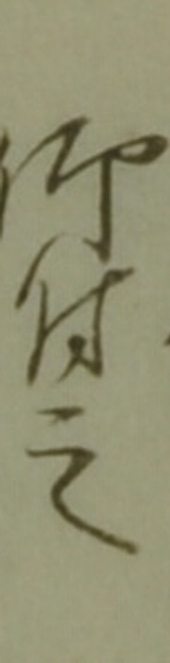仰付之
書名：諸御役代々録（七）
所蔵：伊那市立高遠町図書館・合同会社AMANE
